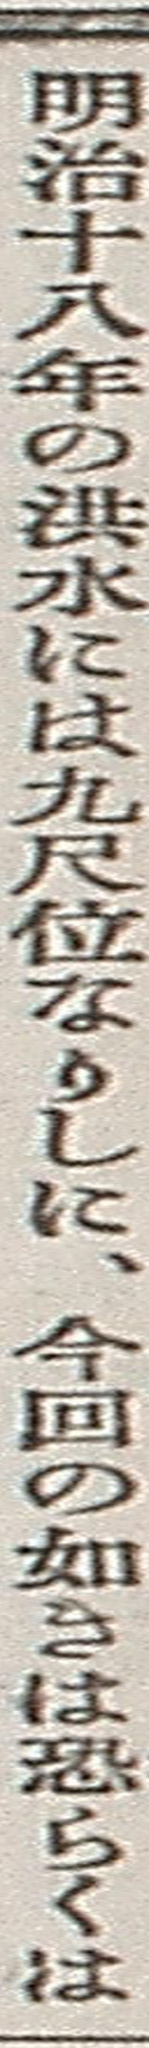明治十八年の洪水には九尺位なりしに、今回の如きは恐らくは
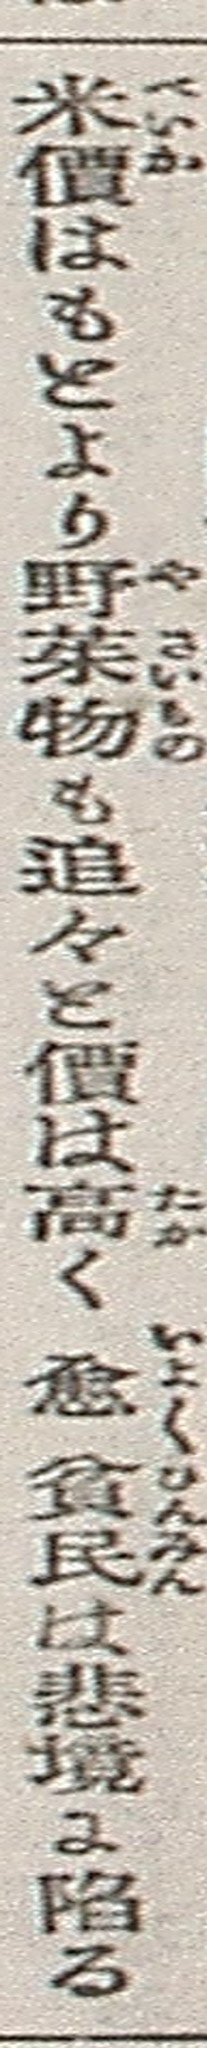米価はもとより野菜物も追々と価は高く愈貧民は悲境に堕る

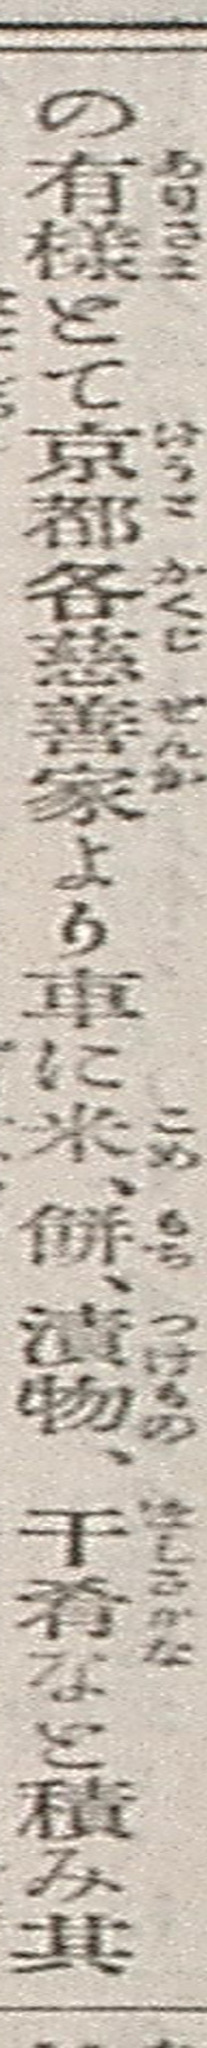の有様とて京都各慈善家より車に米、餅、漬物、干肴など積み其
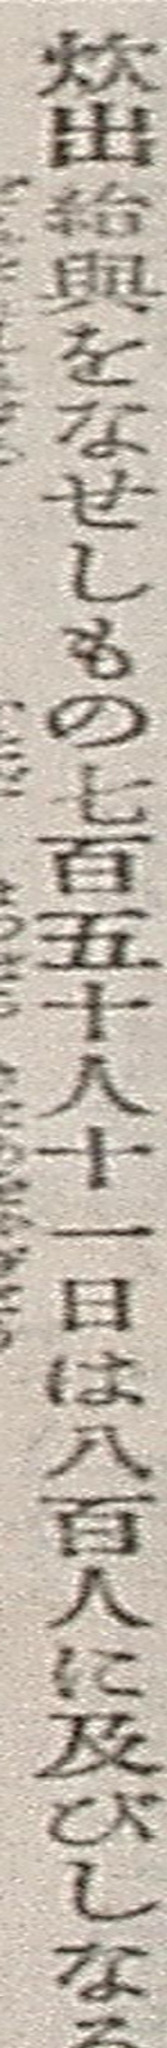炊出給与をなせしもの七百五十人十一日は八百人に及びしなる
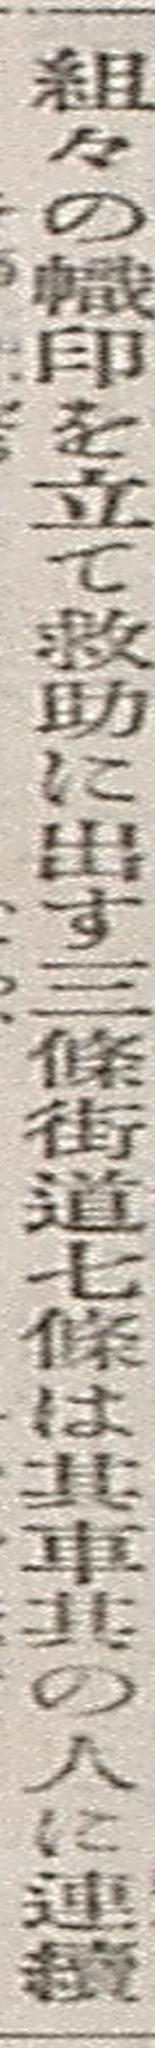組々の幟印を立て救助に出す三條街道七條は其車其の人に連続
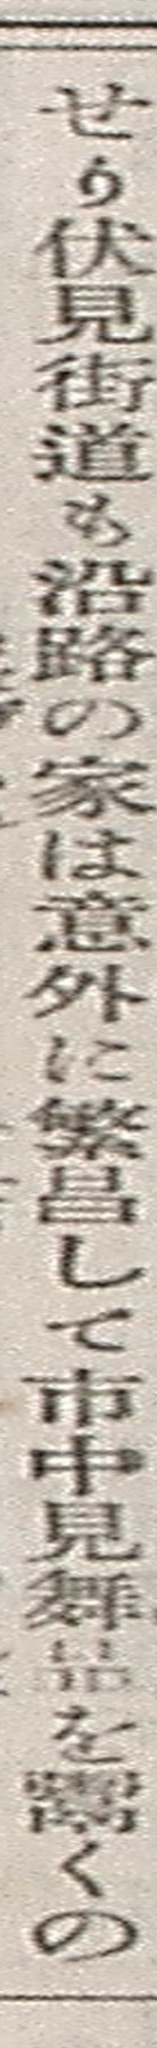せり伏見街道も沿路の家は意外に繁昌して市中見舞品をくの
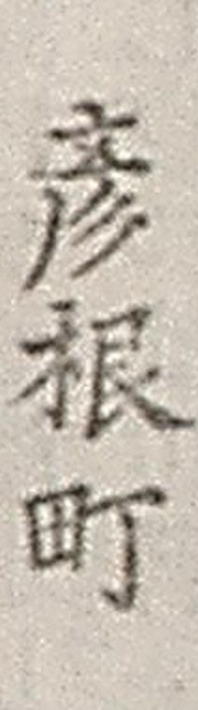彦根町
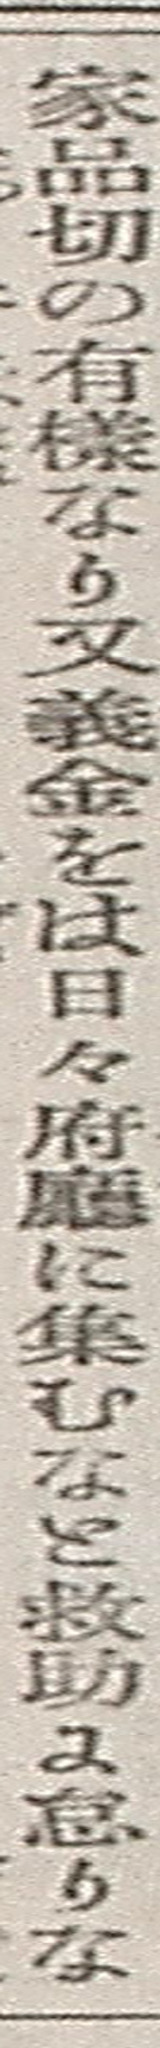家品切の有様なり又義金をは日々府庁に集むなと救助に怠りな
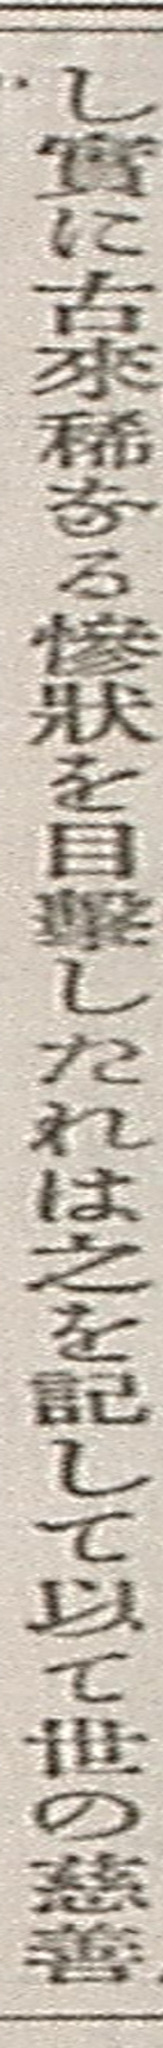し実に古来稀なる惨状を目撃したれは之を記して以て世の慈善
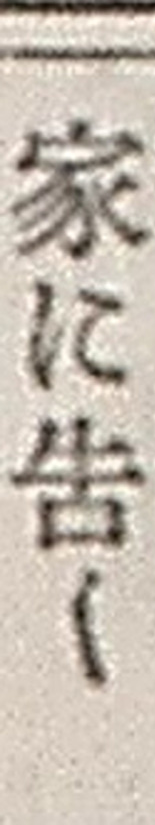家に告く
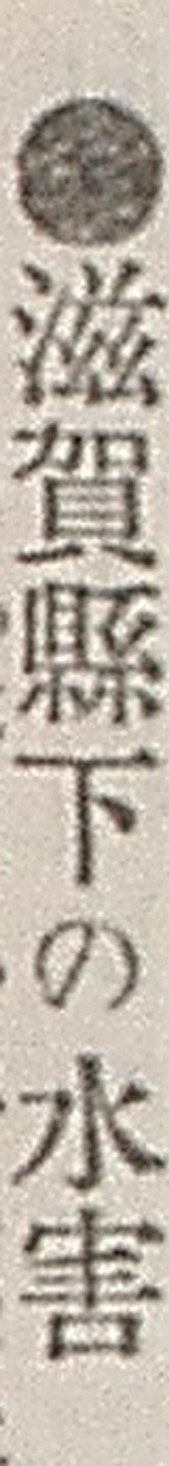●滋賀縣下の水害
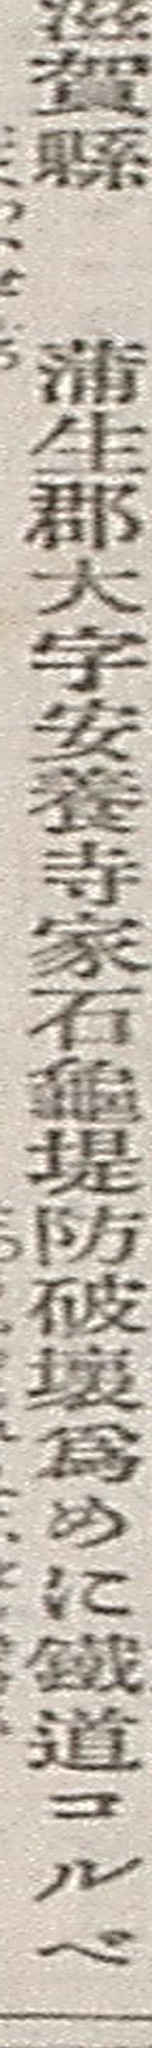滋賀縣蒲生郡大字安養寺家石亀堤防破壊為めに鉄道コルベ
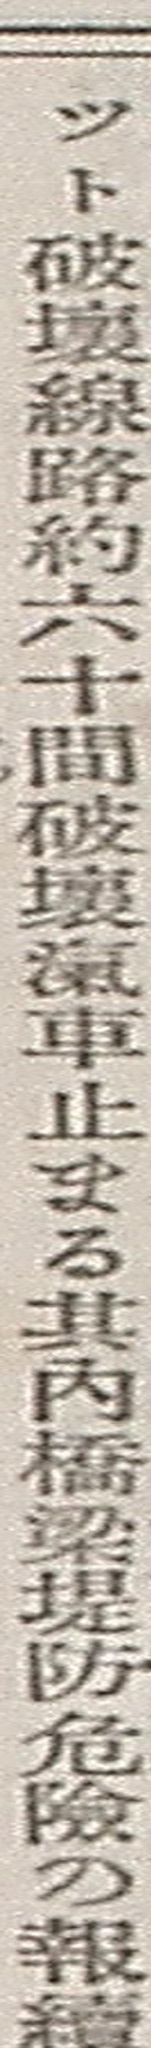ッㇳ破壊線路約六十間破壊汽車止まる其内橋梁堤防危険の報続
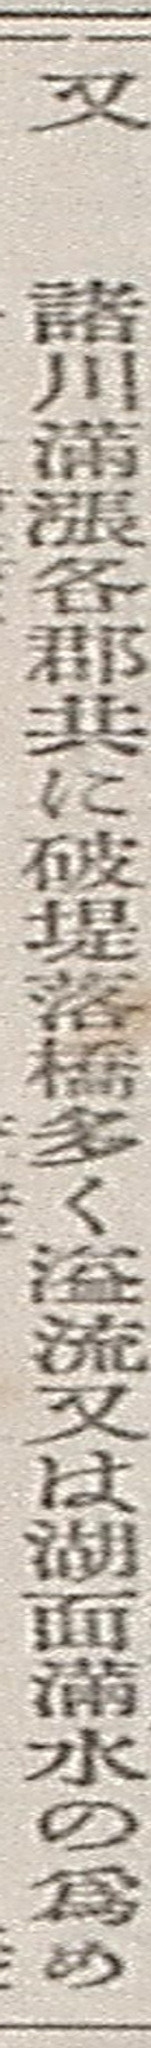又諸川万漲各郡共に破堤落橋多く溢流又は湖面満水の為め
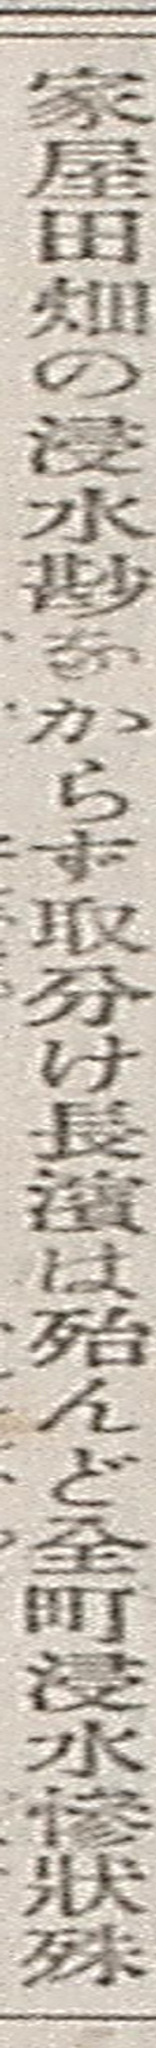家屋田畑の浸水尠なからず取分け長浜は殆んど全町浸水惨状殊
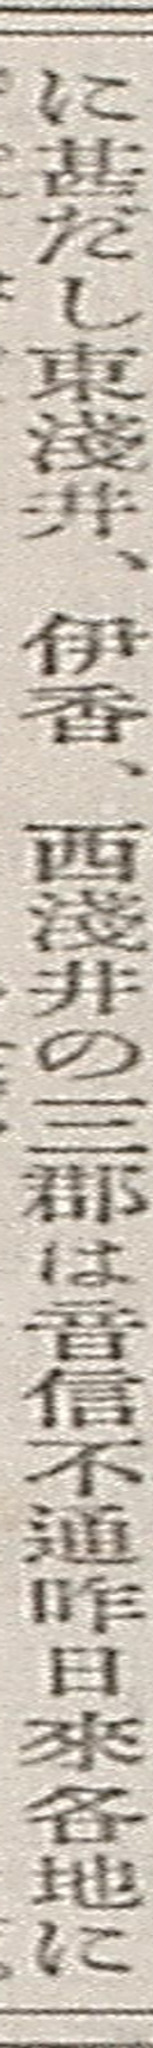に甚だし東浅井、伊香、西浅井の三郡は音信不通昨日來各地に
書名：風俗畫報臨時増刊第百二十八號　洪水被害録（下）
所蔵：東京大学地震研究所図書室 Earthquake Research Institute Library, The University of Tokyo, JAPAN
